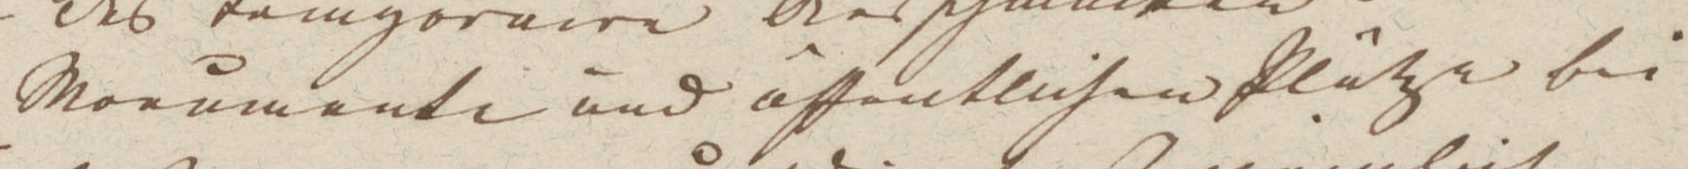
Monumente und öffentlichen Plätze bei
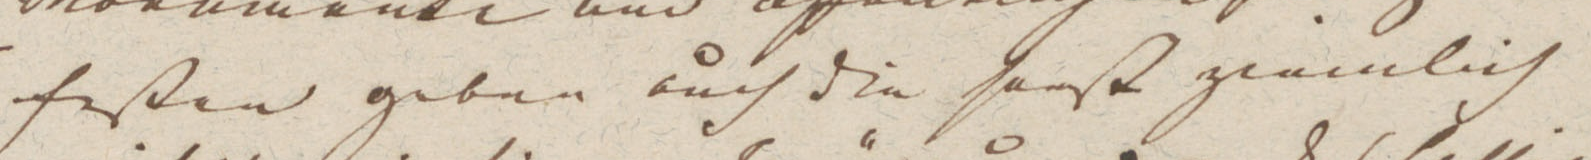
Festen geben auch die sonst ziemlich
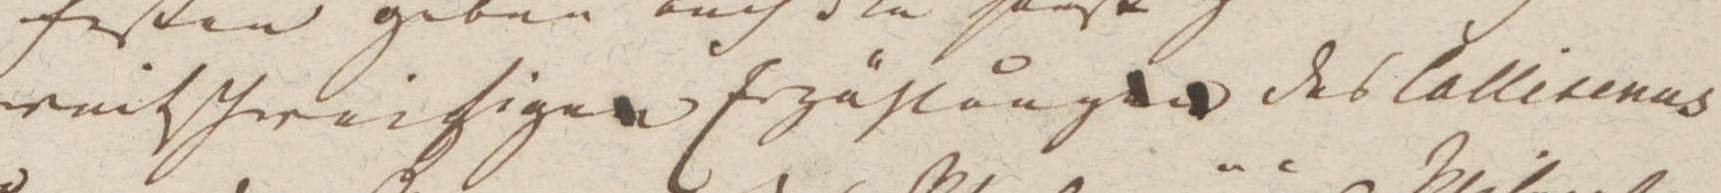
weitschweifigen Erzählungen des Callixenus
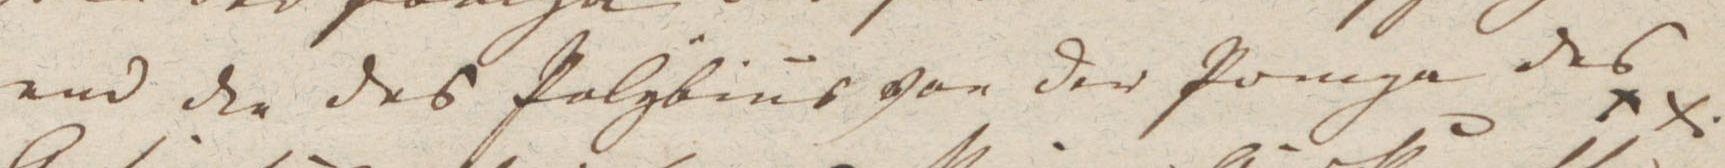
und die des Polybius von der Pompa des
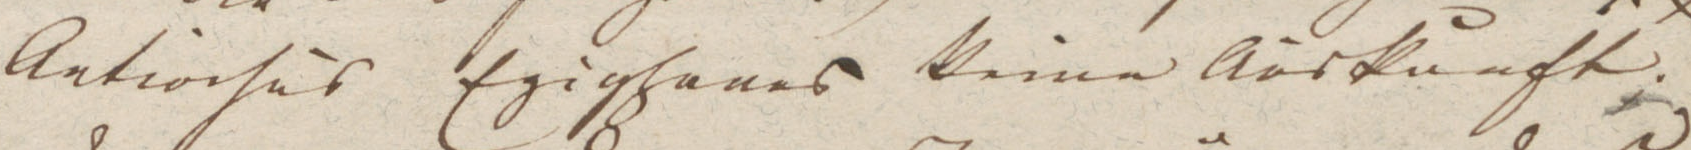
Antiochus Epiphanes keine Auskunft,. %
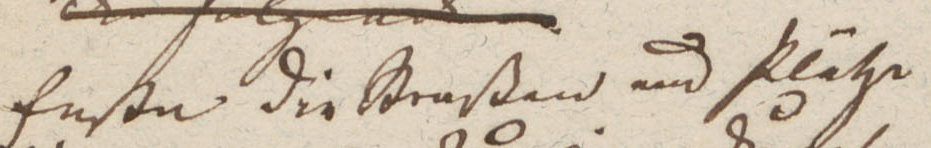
Feste die Strassen und Plätze
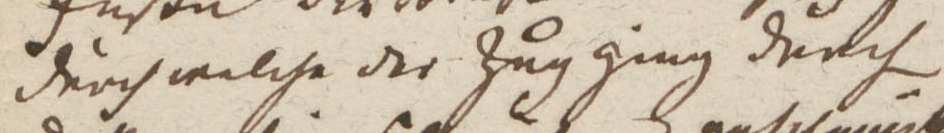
durch welche der Zug ging durch
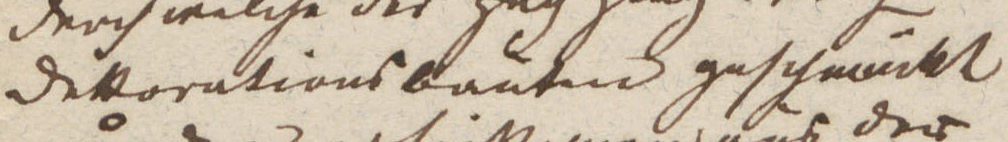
Dekorationsbauten geschmückt
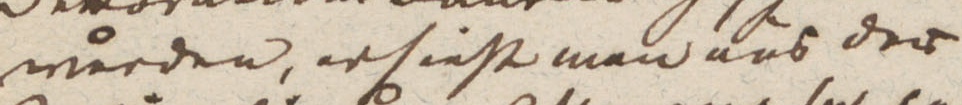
wurden, ersieht man aus der
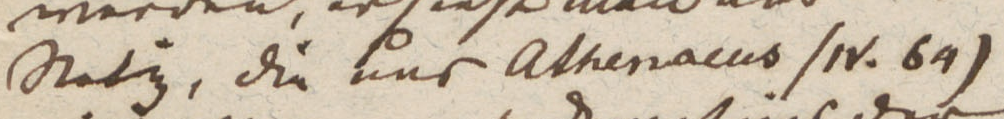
Notiz, die uns Athenaeus (IV. 64)
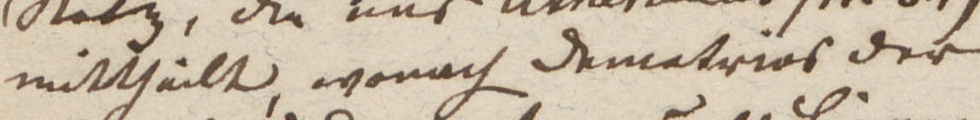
mittheilt, wonach Demetrios der
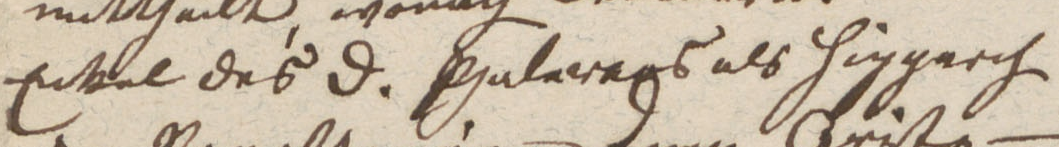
Enkel des D. Phaleraios als Hipparch
